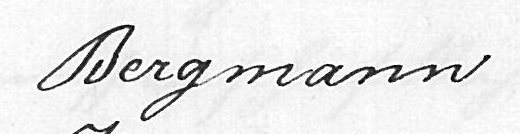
Bergmann
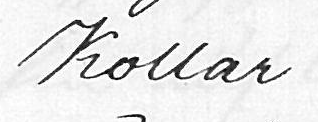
Kollar
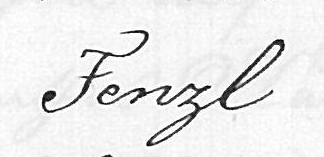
Fenzl
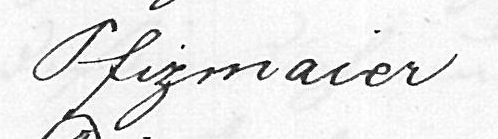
Pfizmaier
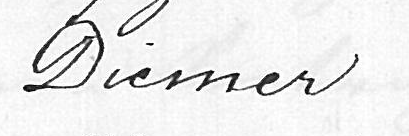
Diemer
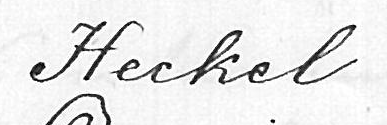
Heckel
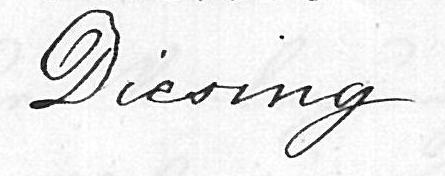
Diesing
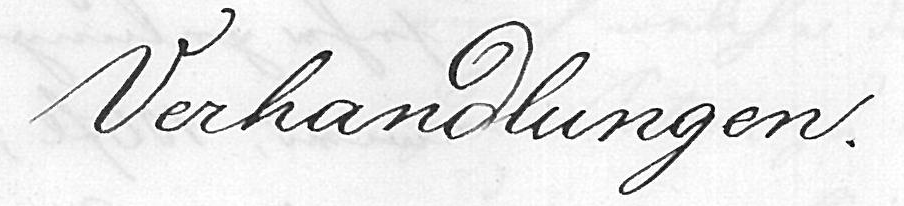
Verhandlungen.
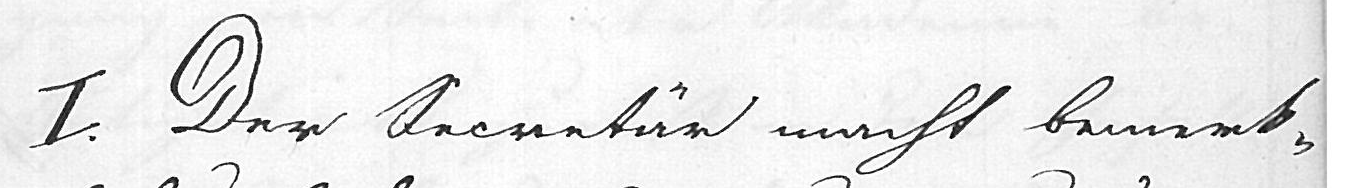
I. Der Secretär macht bemerk-
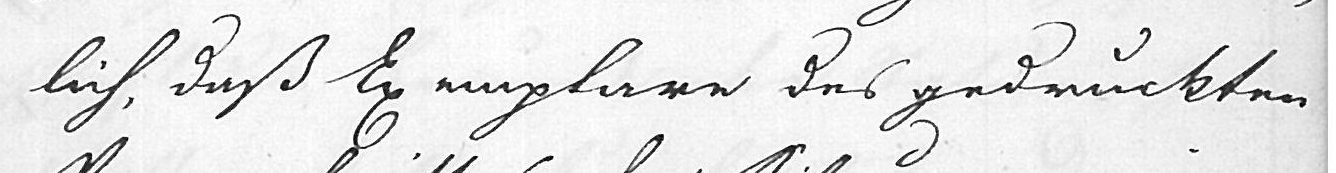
lich, daß Exemplare des gedruckten
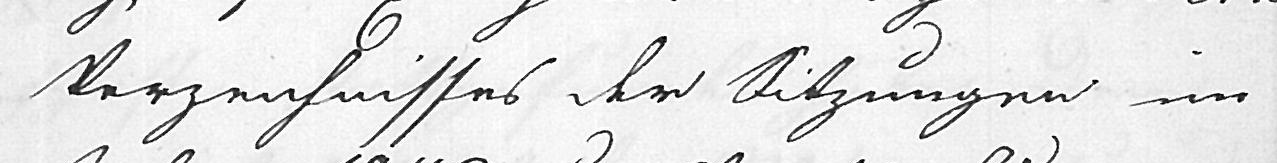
Verzeichnisses der Sitzungen im
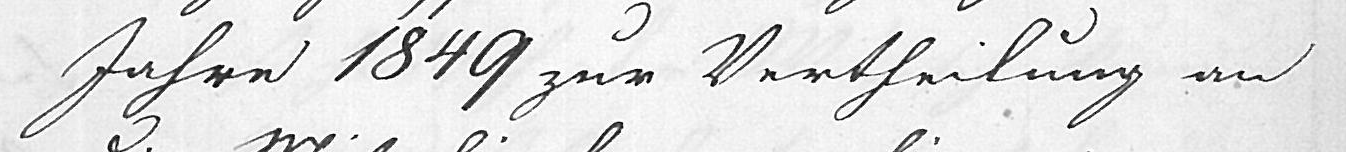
Jahre 1849 zur Vertheilung an
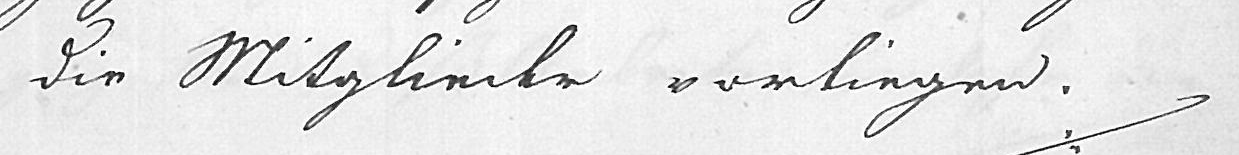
die Mitglieder vorliegen.
